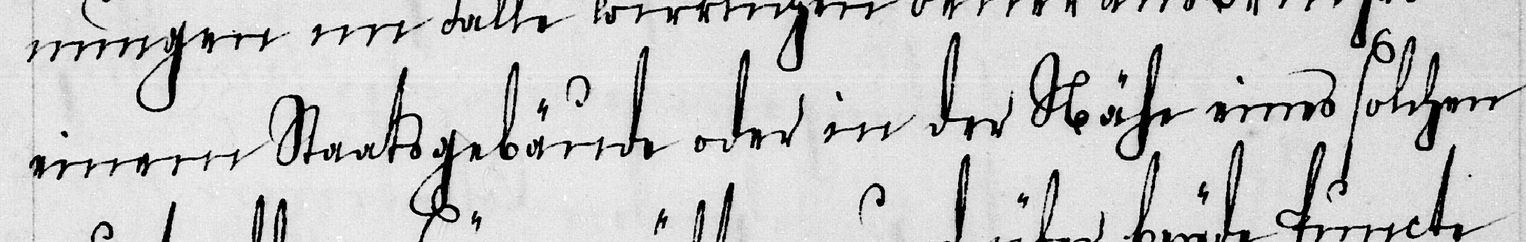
einem Staatsgebäude oder in der Nähe eines solchen
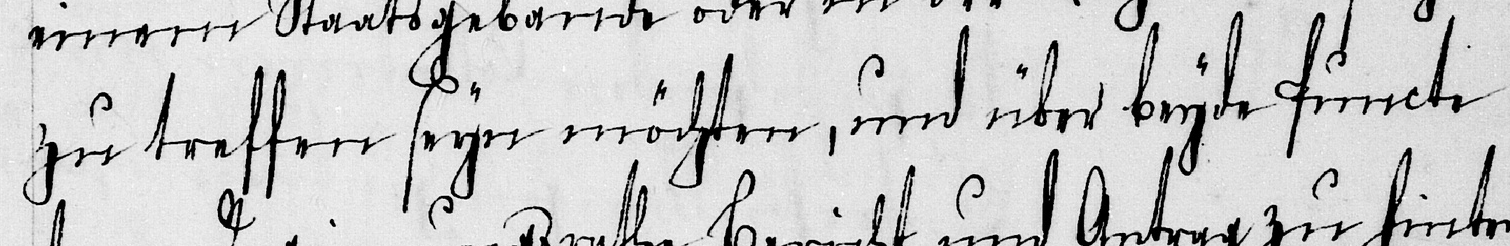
zu treffen seyn möchten, und über beyde Puncte
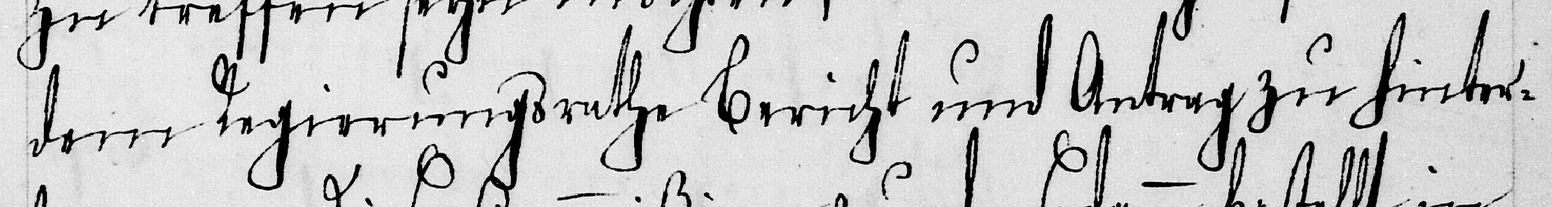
dem Regierungsrathe Bericht und Antrag zu hinter¬
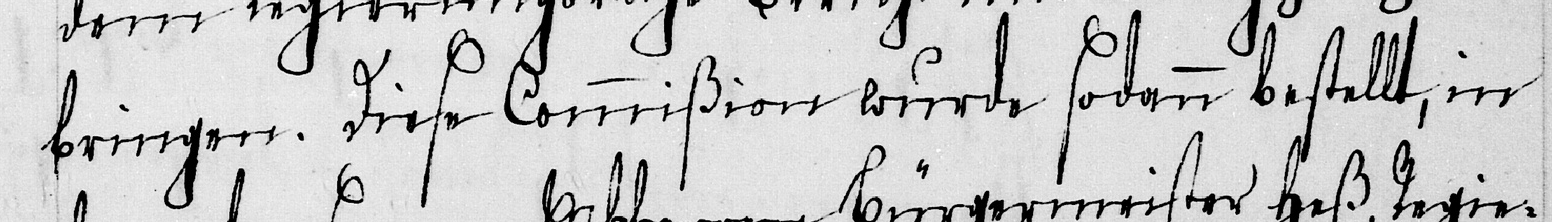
bringen. Diese Commißion wurde sodann bestellt, in
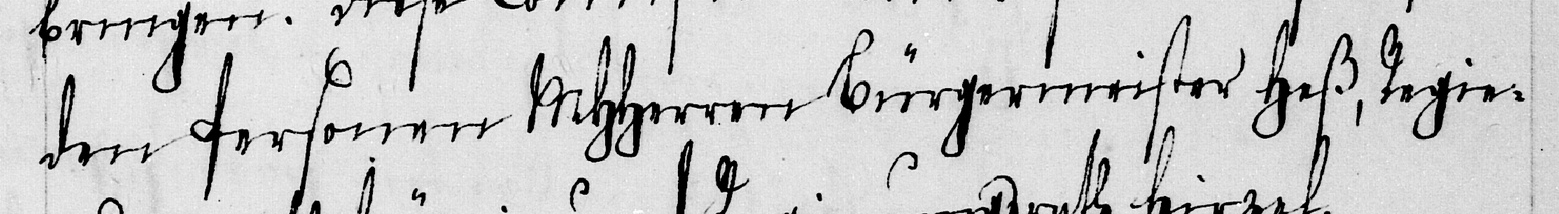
den Personen MHHerren Bürgermeister Heß, Regie¬
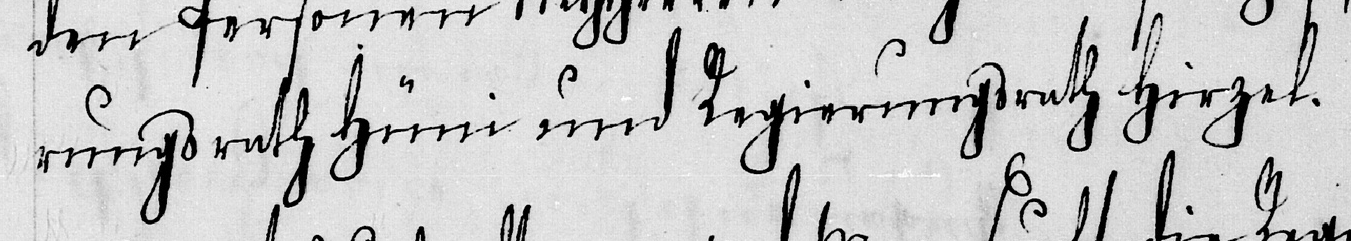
rungsrath Hüni und Regierungsrath Hirzel.
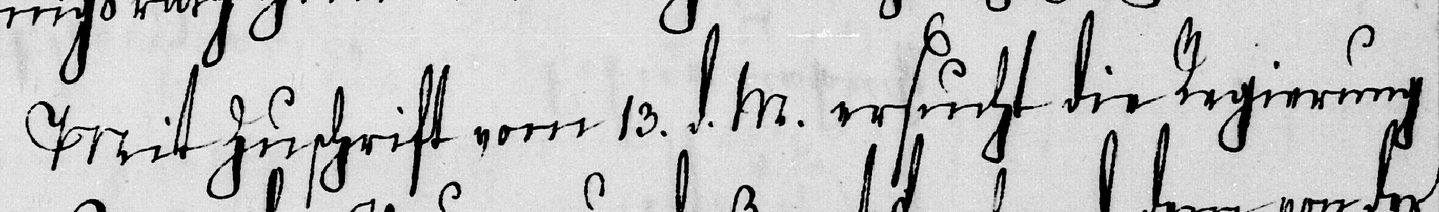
Mit Zuschrift vom 13. d. M. ersucht die Regierung
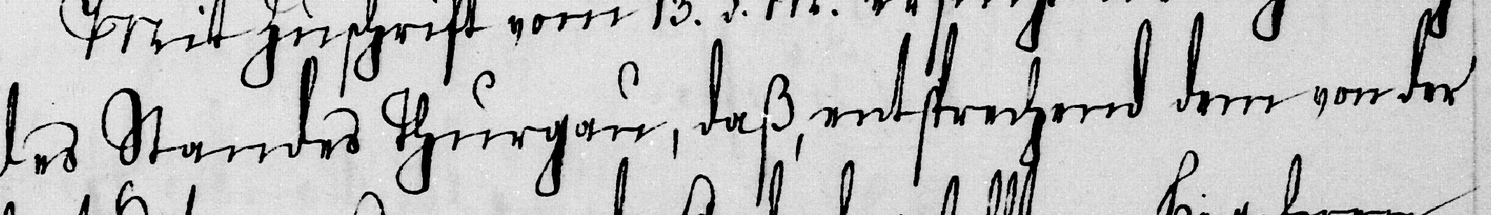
des Standes Thurgau, daß, entsprechend dem von der
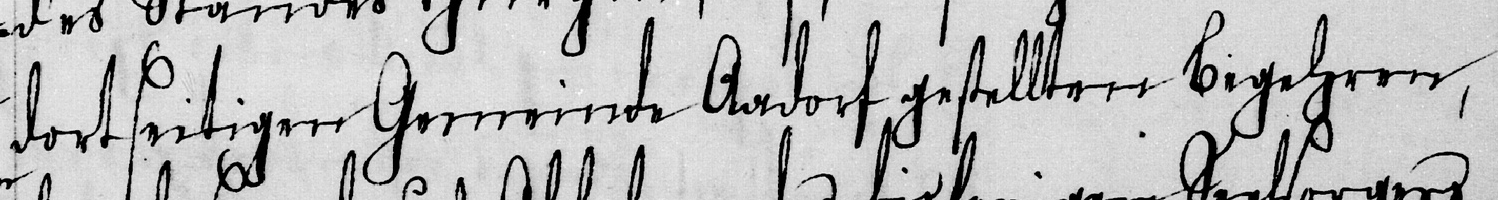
dortseitigen Gemeinde Aadorf gestellten Begehren,
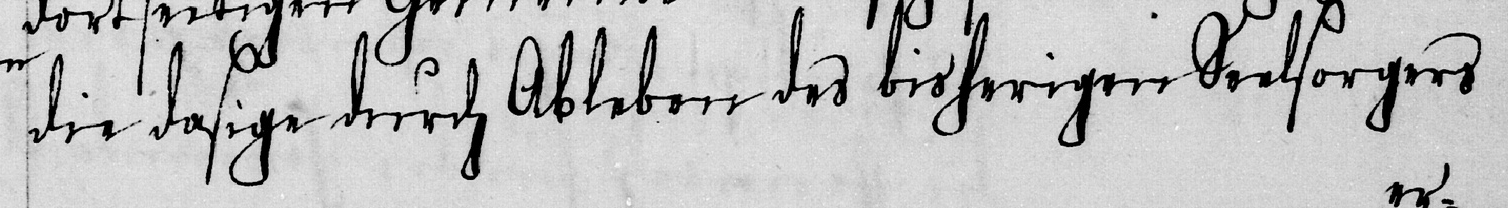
die dasige durch Ableben des bisherigen Seelsorgers
